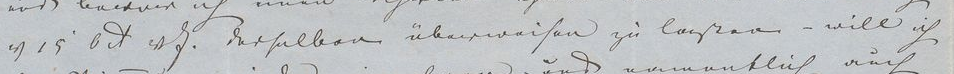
v 15 Oct vJ. derselben überweisen zu laßen, will ich
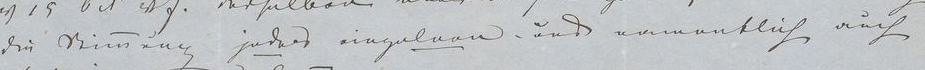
die Stimmung jedeseinzelnen und namentlich auch
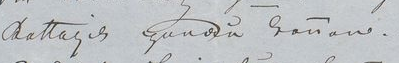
Rattazis genau kennen. –
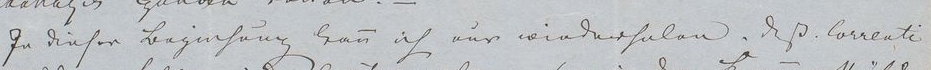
In dieser Bezieung kann ich nur wiederholen, daß Correnti
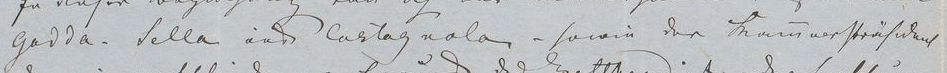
Gadda, Sella und Castagnola sowie der KammerPräsident
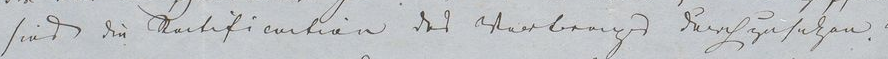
sind die Ratification des Vertrags durchzusetzen.
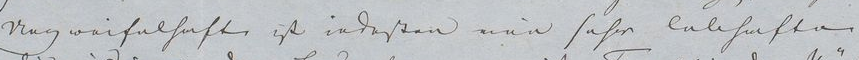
Unzweifelhaft ist indeßen eine sehr lebhafte
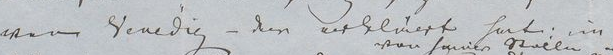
von Venedig, der erklärt hat: im
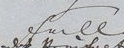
Fall
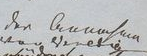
der Annahme
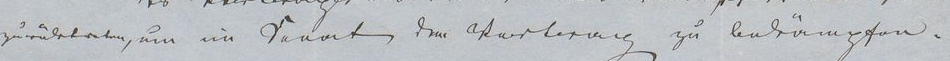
zurücktreten, um im Senat den Vertrag zu bekämpfen. –
